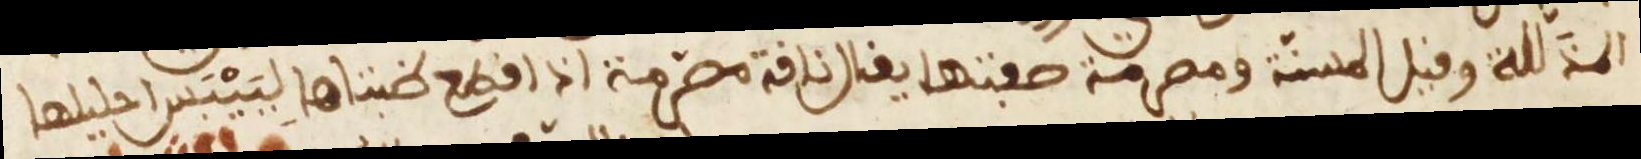المذللة و قيل المسنة و مصرمة صفتها يقال ناقة مصرمة اذا قطع ظبتاها لييبس احليلها
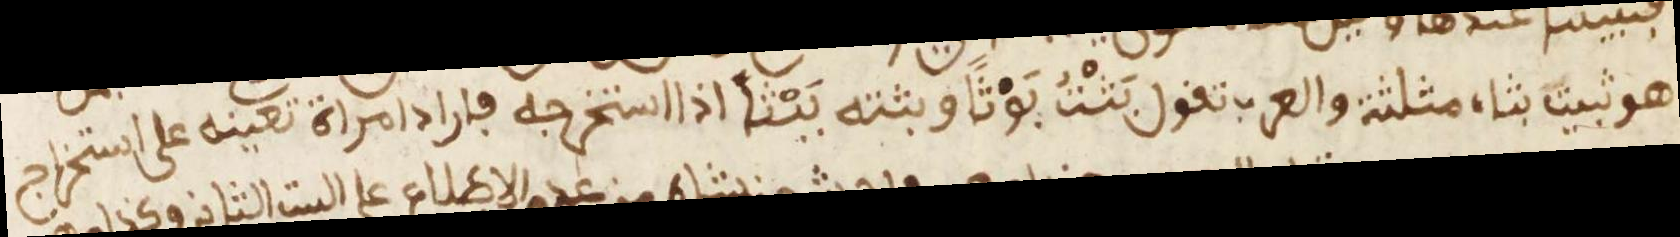هو ثبيت بثاء مثلثة و العرب تقول بثت بوثا و بثته ببثأ اذا استخرجه فاراد امراة تعينه على استخراج
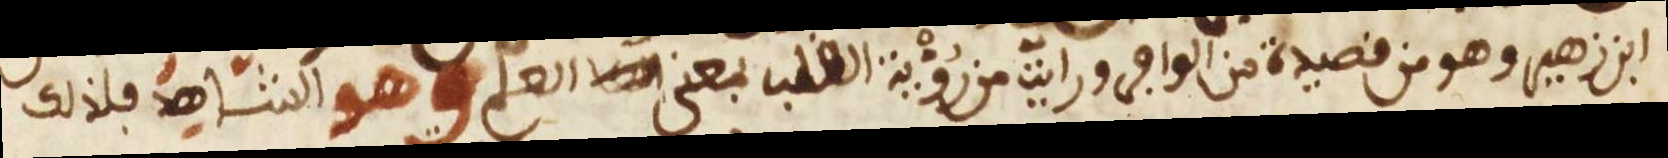ابن زهير و هو من قصيدة من الوافر و رايت من رؤية القلب بمعنى العلم و هو الشاهد فلذلك
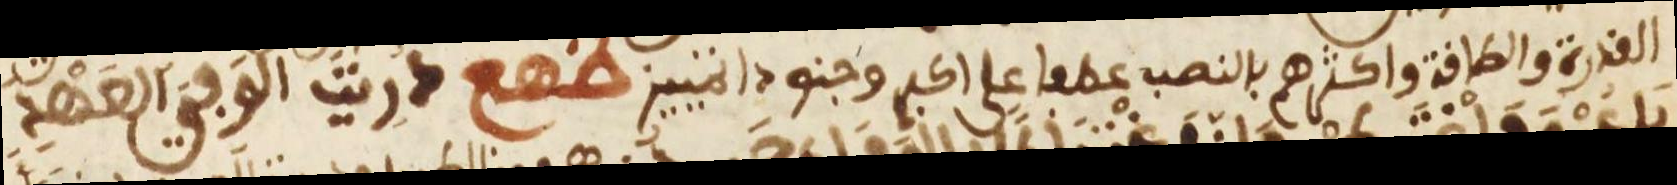القدرة و الطاقة و اكثرهم بالنصب عطفا على اكبر و جنودا تمييز ظهع دريت الوفي العهد
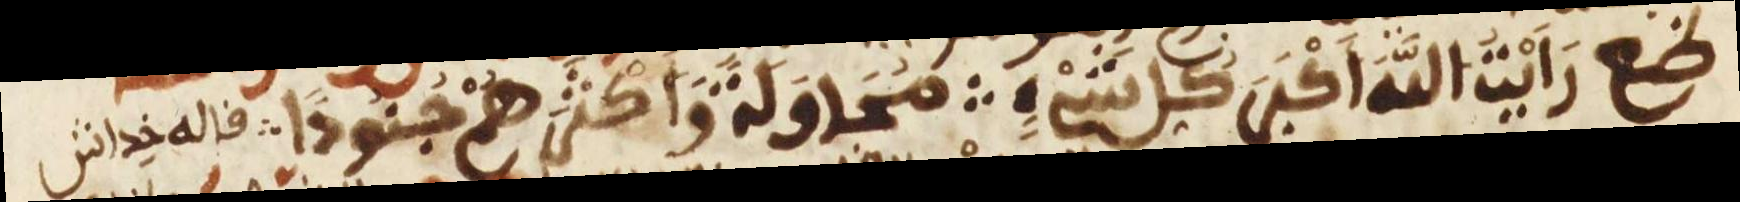ظع رايت الله أكبر كل شيء محاولة و أكثرهم جنودا قاله خداش
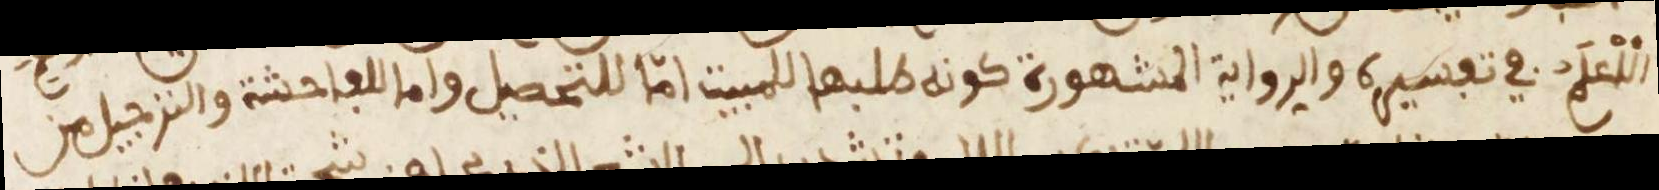الاعلم في تفسيره و الرواية المشهورة كونه طلبها للمبيت اما للتحصيل واما للفاحشة و الترجيل من
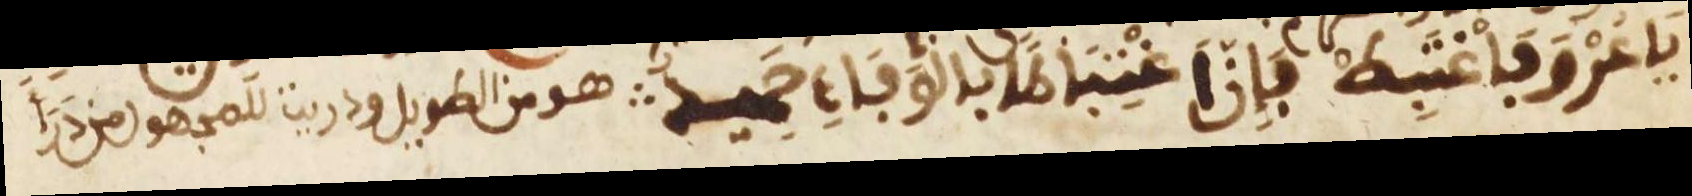يا عرو فاغتبط فإن اغتباطا بالوفاء حميد هو من الطويل و دريت للمجهول من درأ
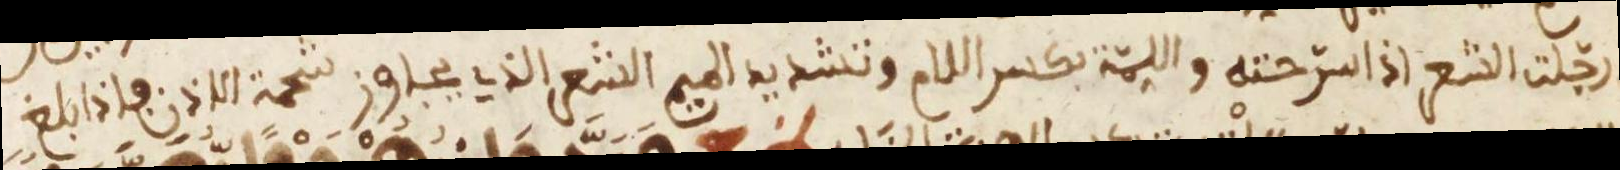رجّلت الشعر اذا سرّحته و اللمة بكسر اللام و تشديد الميم الشعر الذي يجاوز شحمة الاذن فاذا بلغ
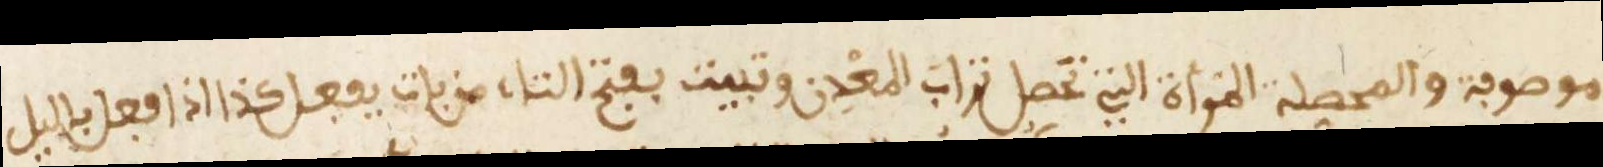موصوفة و المحصلة المرأة التي تحصل تراب المعدن و تبيت بفتح التاء من بات يفعل كذا اذا فعل باليل
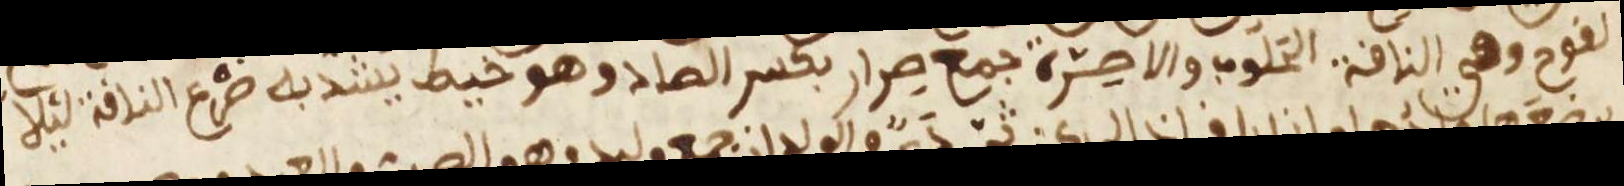لقوح و هي الناقه الحلوب و الاصرة جمع صرار بكسر الصاد و هو خيط يشد به ضرع الناقة ليلا
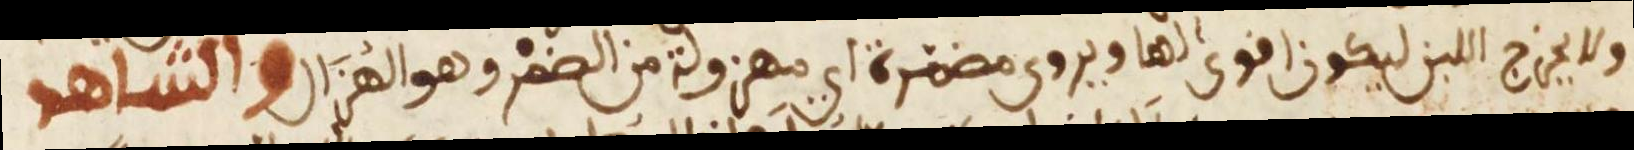و لا يخرج اللبن ليكون اقوىٰ لها و يروى مضمرة اي مهزولة من الضمر و هو الهزال و الشاهد
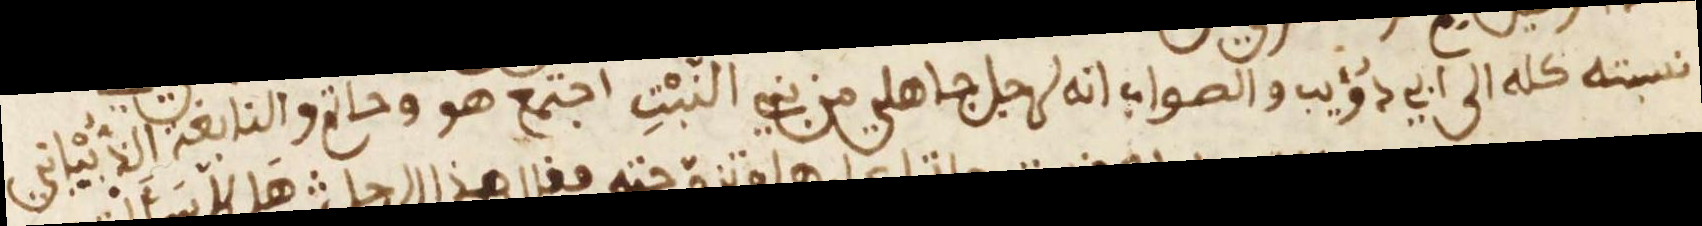نسبته كله الى ابي دؤيب و الصواب انه لرجل جاهلي من بني النبت اجتمع هو وحاتم و النابغة الذبياني
